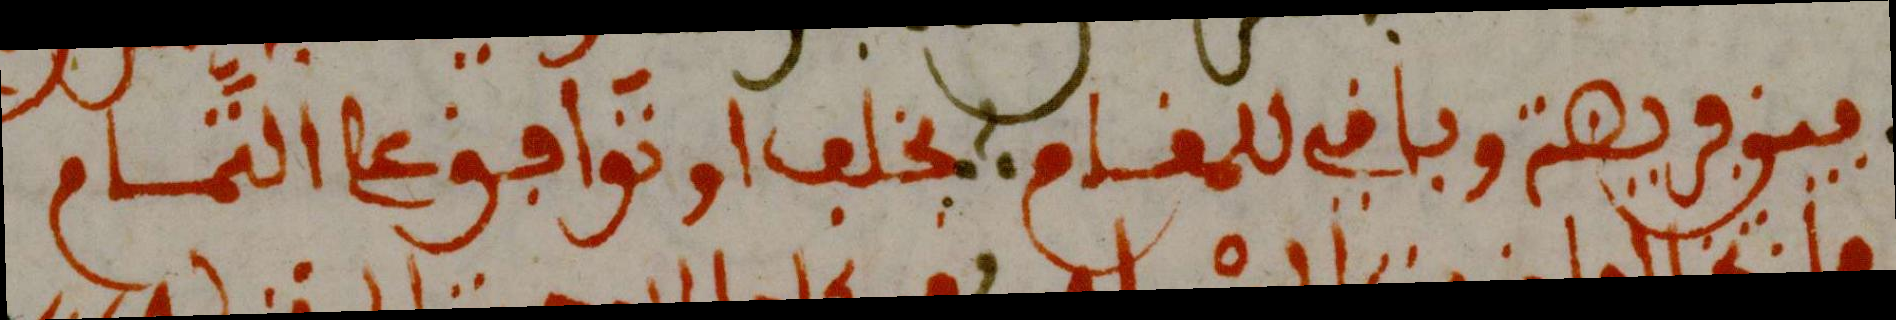بين فريضة وباقي للمقام بخلف او توافق على التّمام
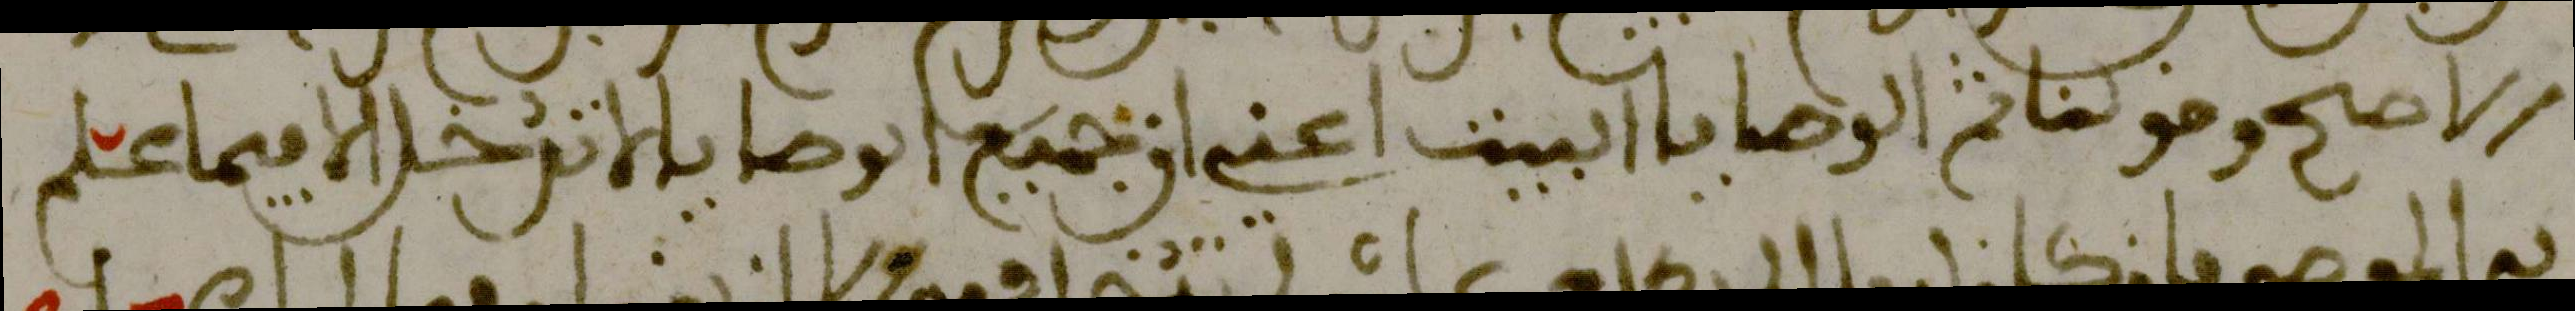الاصح وقولنا ثم الوصايا البيت لعني ان جميع الوصايا لا تدخل الا فيما علم
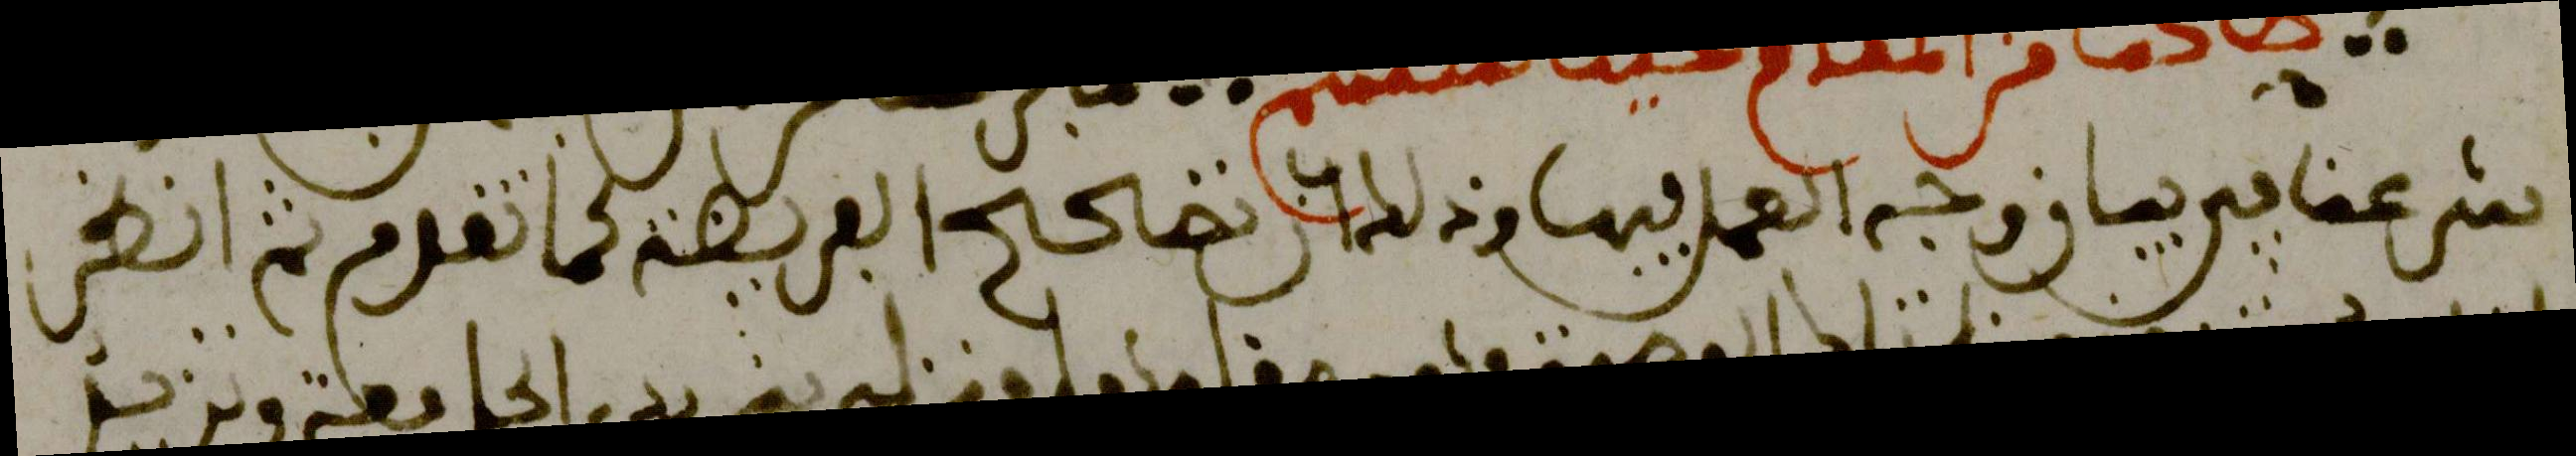شرعنا في بيان وجه العمل فيها وذلك ان تصحح الفريضة كما تقدم ثم انظر
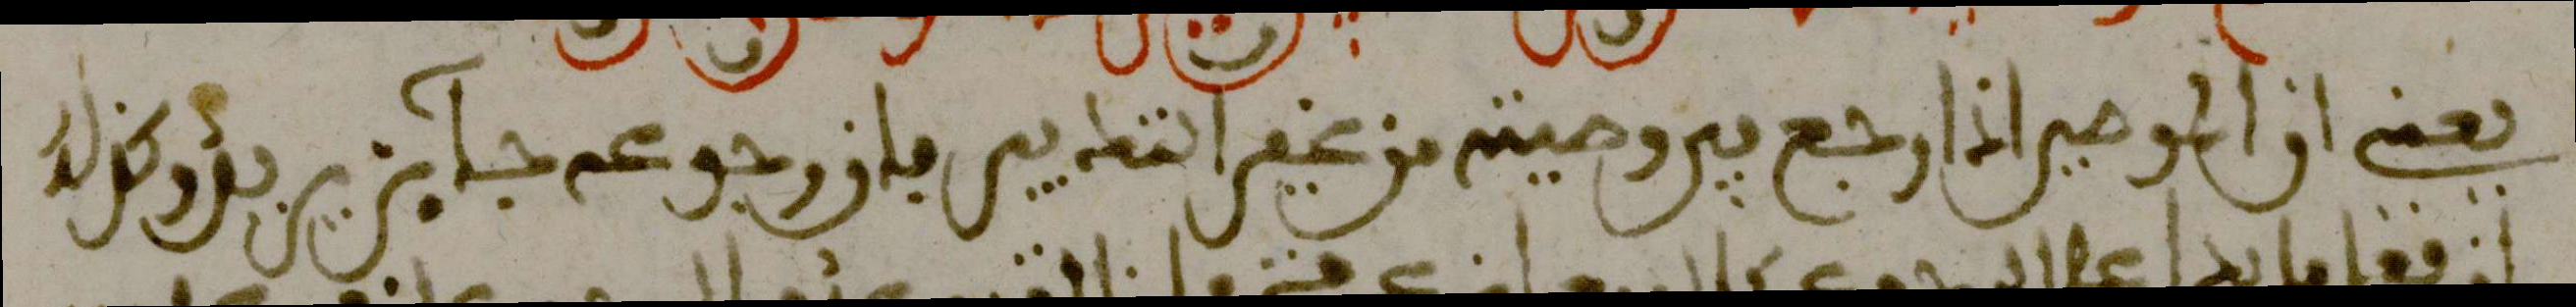يعني ان الموصي اذا رجع في وصيته من غير التدبير فان رجوعه جائزير يد وكذلك
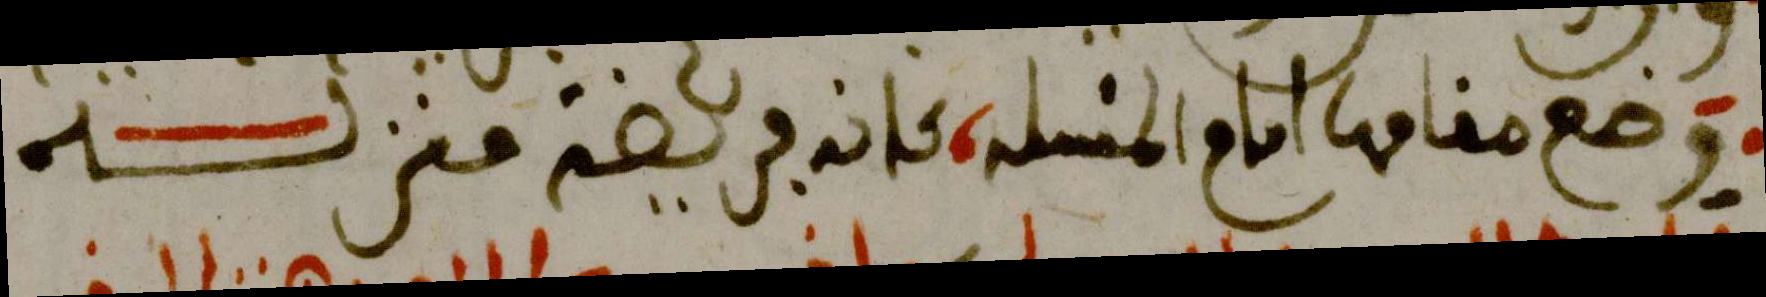وضع مقامها امام المسئله كانه فريضة منزله
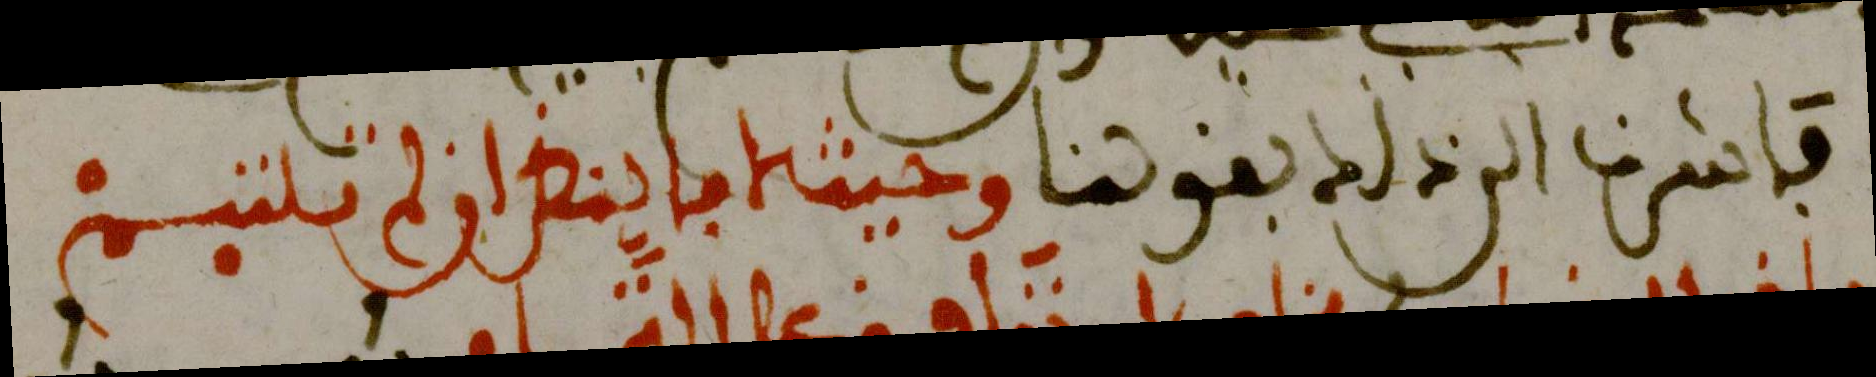فاشرن الى ذلك بقولنا وحيث لا فالنظر ان تلتئم
